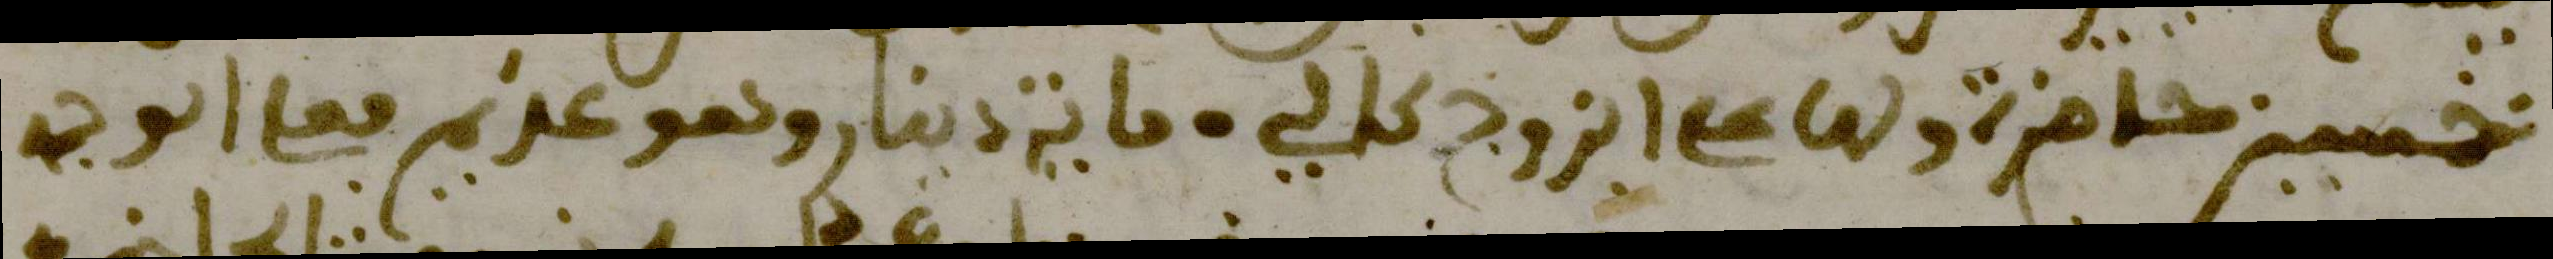خمسين حاضرة ولها على الزوج كاليء ماية دينار وهو عديم فعلى الوجه
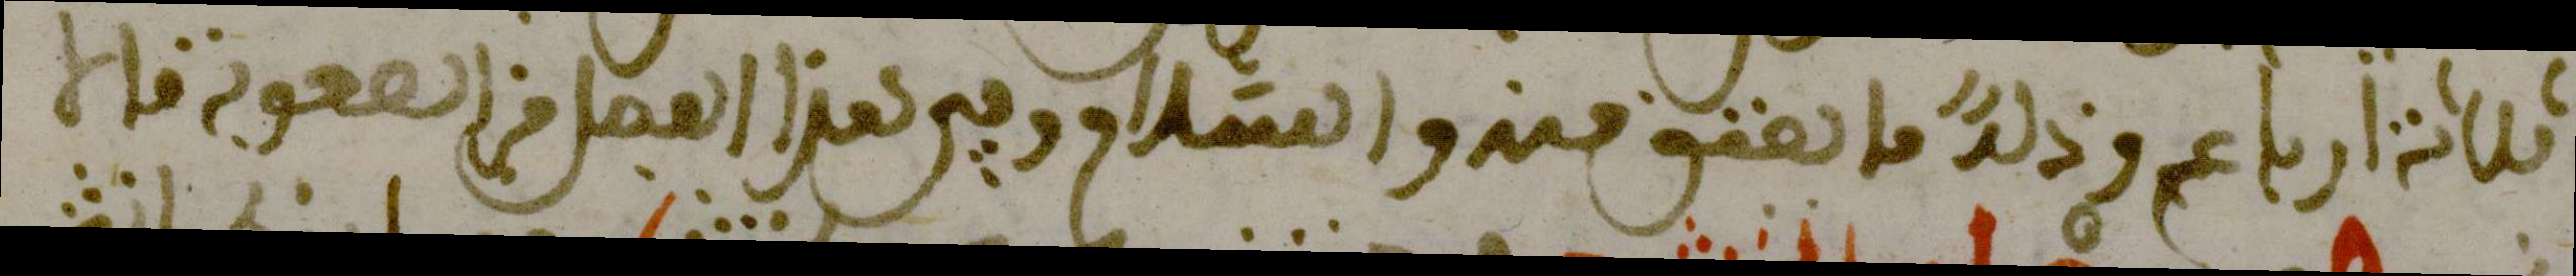ثلاثة ارباع وذلك ما يعتق منه والسّلام وفي هذا الفصل من الصعوبة ما لا
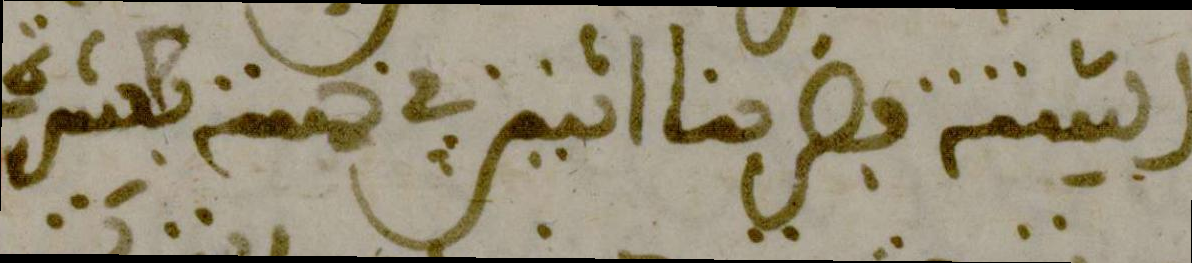السِّتة فضر بنا اثنين في خمسة بعشرة
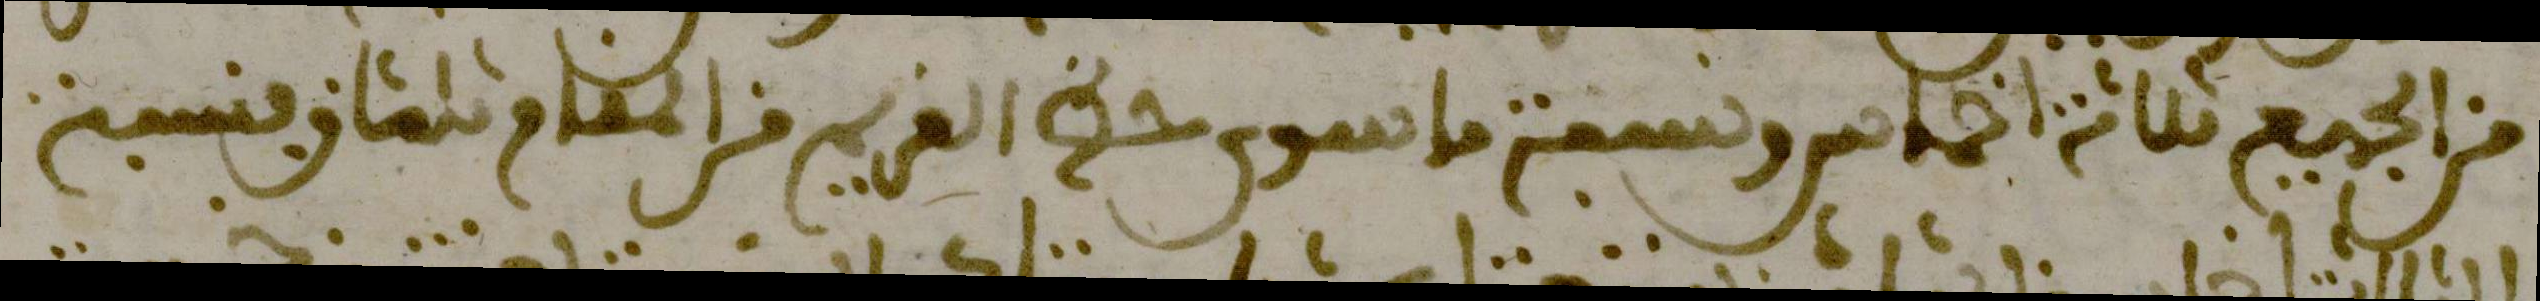من الجميع ثلاثة اخماس ونسبة ما سوى حظ الغريم من المقام ثلثان فنسبة
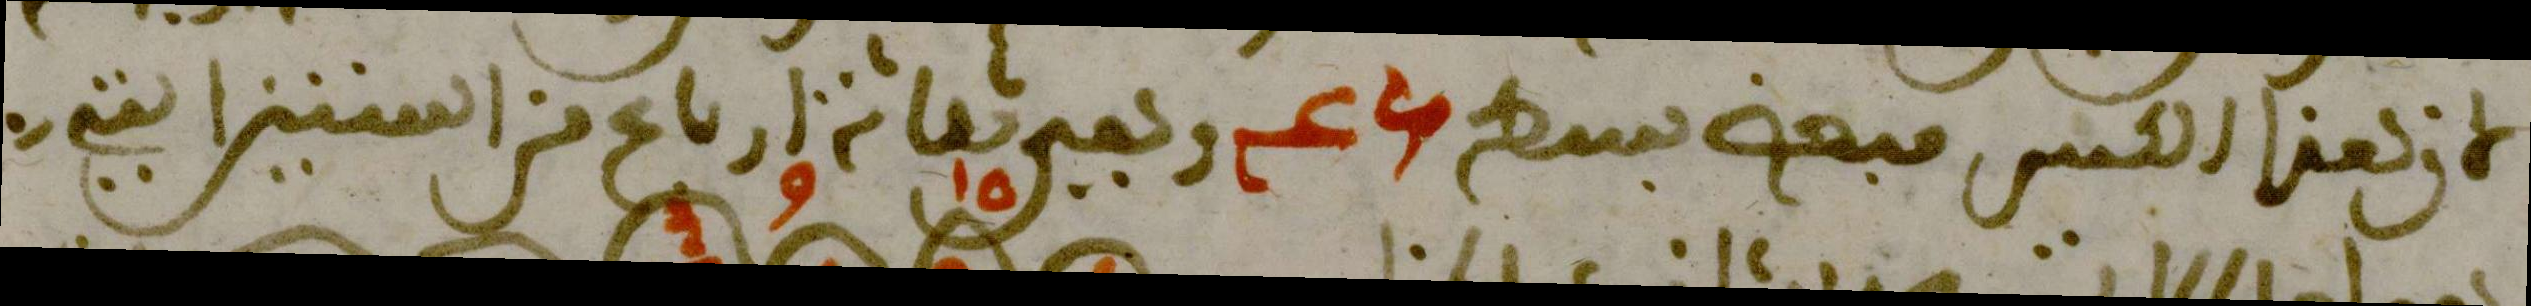لان هذا الكسر مبعض سبطه 25 وهي ثلاثة ارباع من الستين التي
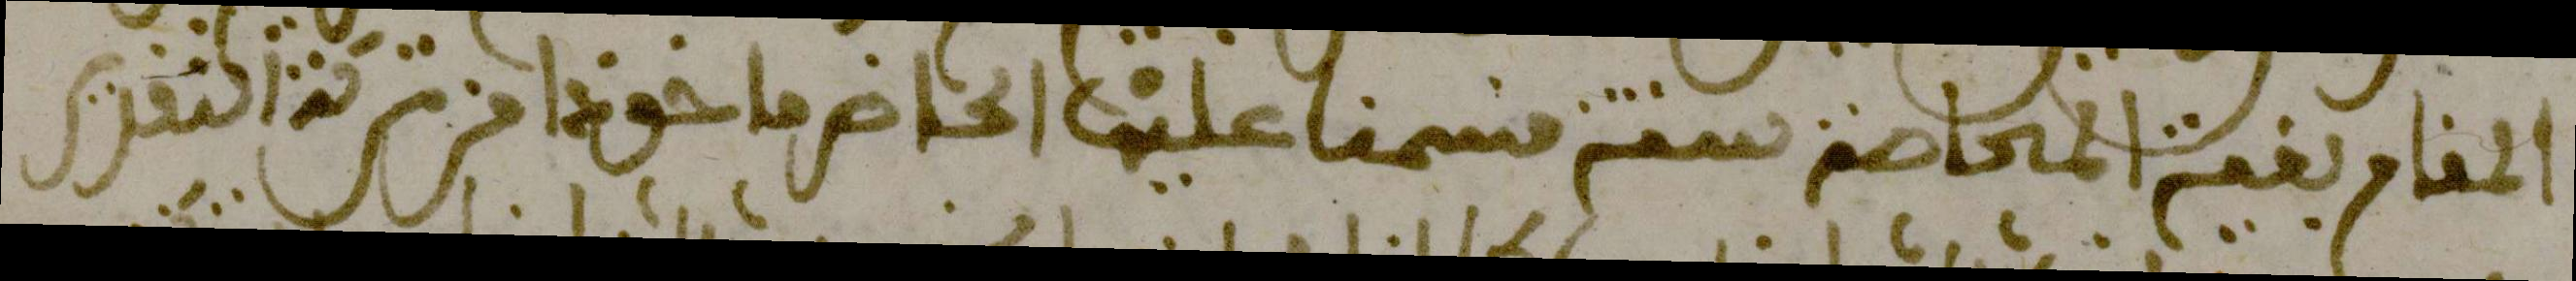المقام بقيت المحاصة ستة قسمنا عليْها الحاضر ماخوذا من تركة التقدير
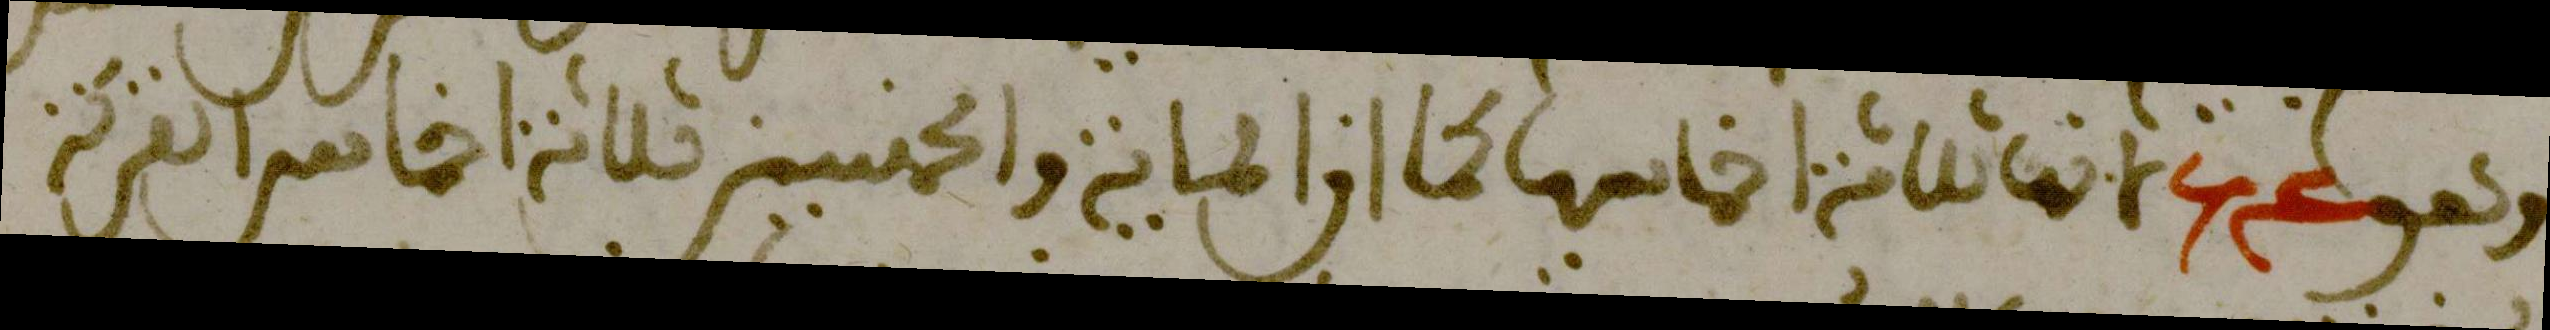وهو54 لانها ثلاثة اخماسها كما ان لماية والخمسين ثلاثة اخماس التركة
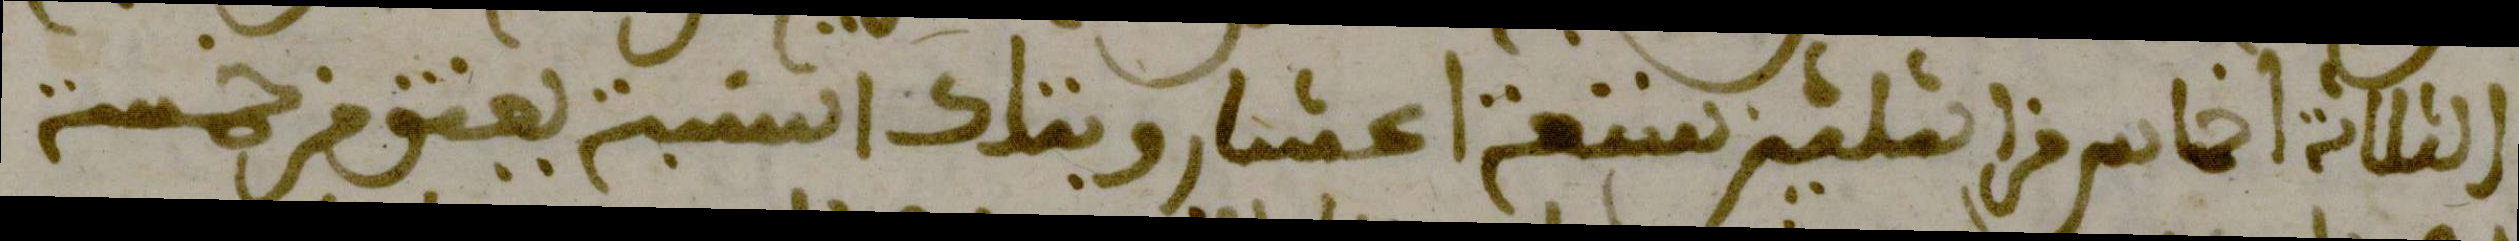الثلاثة اخماس من الثلثين تسعة اعشار وبتلك النسبة يعتق من خمسة
